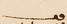قف
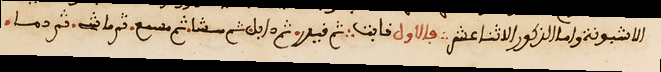الاشبونة واما الزكور الاثنا عشر فالاول قابت ثم قيدر ثم دابل ثم مشا ثم مسمع ثم ما شى ثم دما
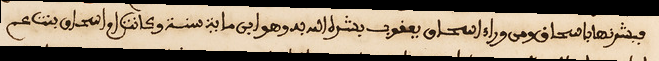فبشرنها باسحاق ومن وراء اسحاق يعقوب بشره الله به وهو ابن ماية سنة وكانت ام اسحاق بنت عم
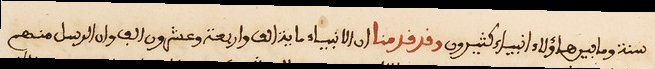سنة وما بين هاؤلاء كثيرون وقد قدمنا ان الانبياء ماية الف واربعة وعشرون الف وان الرسل منهم
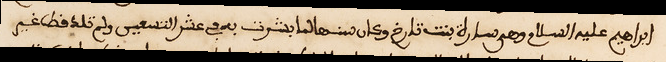ابراهيم عليه السلام وهى سارة بنت تارخ وكان سنها لما بشرت به في عشر التسعين ولم تلد قط غير
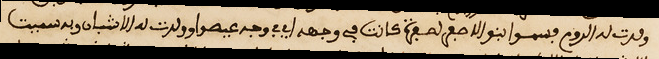ولدت له الروم فسموا بنو الاصفر لصفرة كانت في وجهه اي في وجه عيصوا و ولدت له الاشبان وبه سميت
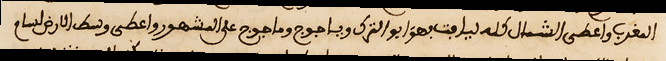المغرب واعطى الشمال كله ليافت بهو ابو الترك وياجوج وماجوج على المشهور واعطى وسط الارض لسام
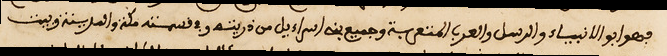فهو ابو الانبياء والرسل والعرب المتعربة جميع بنى اسراءيل من ذريته وفي قسمته مكة والمدينة وبيت
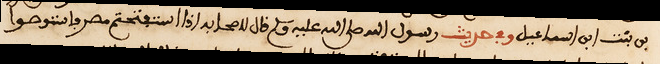بن بنت ابن اسماعيل وفي حديث رسول الله صلى الله عليه وسلم قال لاصحابه اذا استفتحتم مصر فاستوصوا
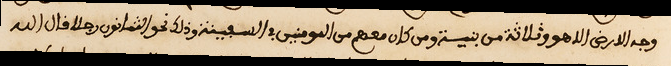وجه الارض الا هو وثلاثة من بنية ومن كان معهم من المومنين في السفينة وذلك نحو الثمانون رجلا قال الله
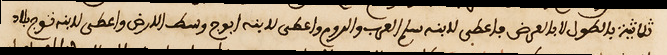ثلاثية بالطول لا بالعرض فاعطى لابته سلم العرب والروم واعطى لابنه ايوج وسط الارض واعطى لابنه توج بلاد
